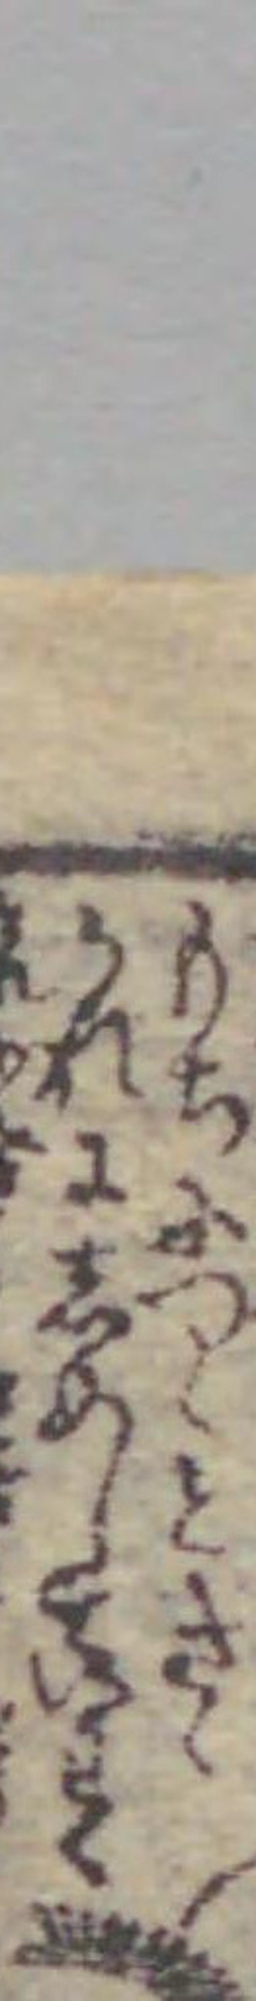かれにしめしていわく
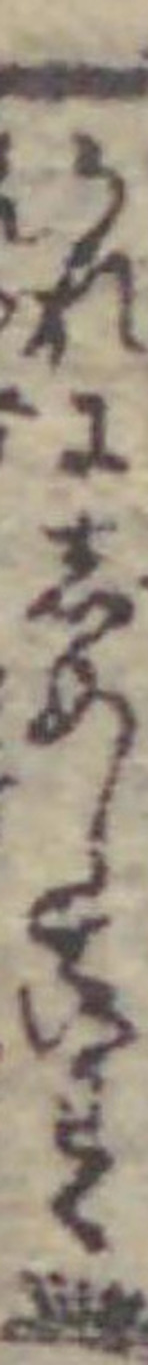かれにしめしていわく
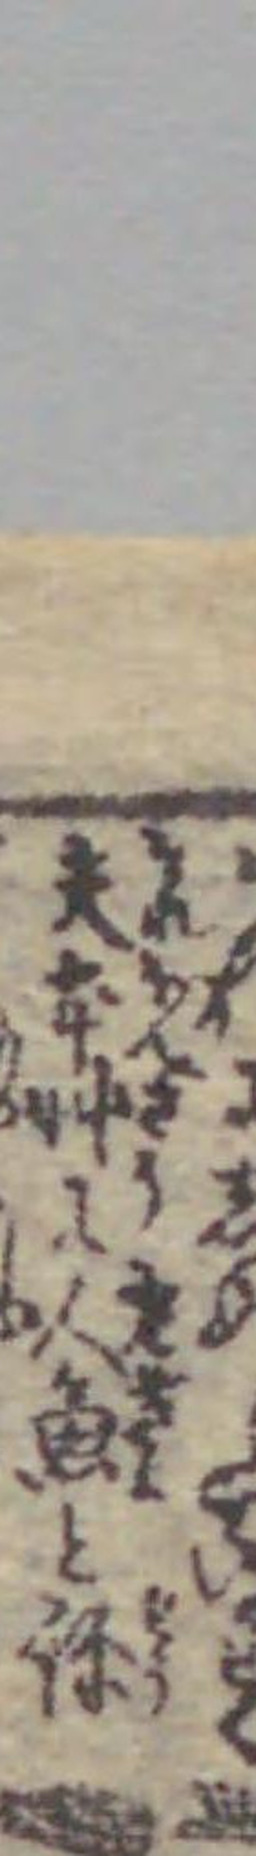夫本艸に人魚と称
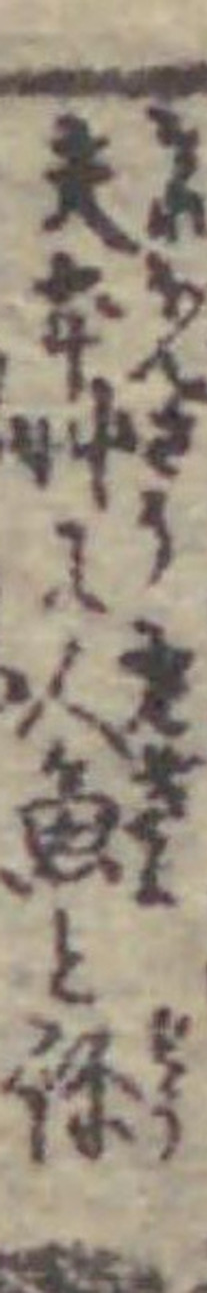夫本艸に人魚と称
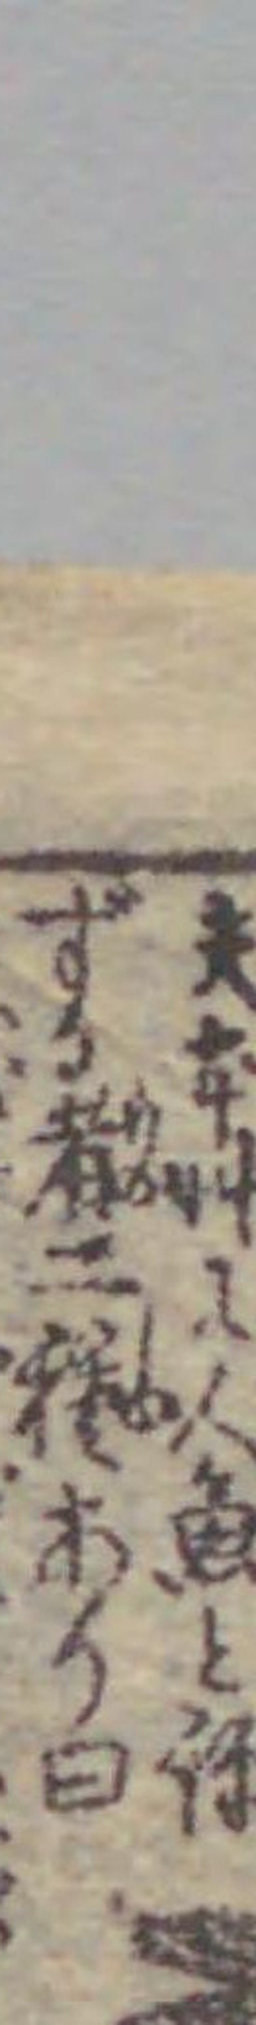ずる者二種あり曰
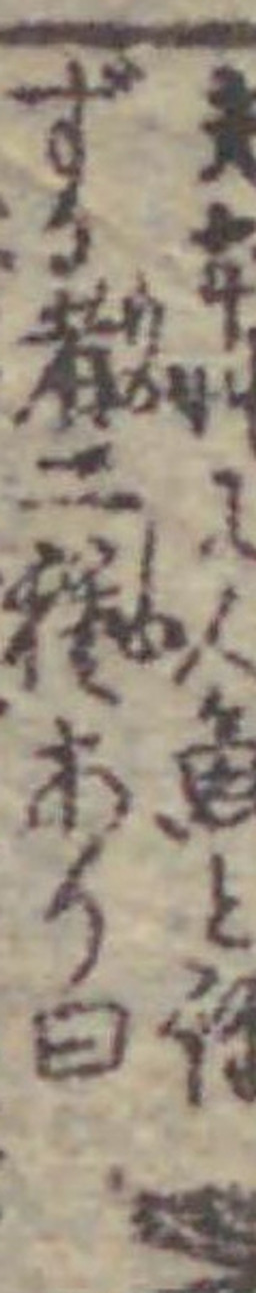ずる者二種あり曰
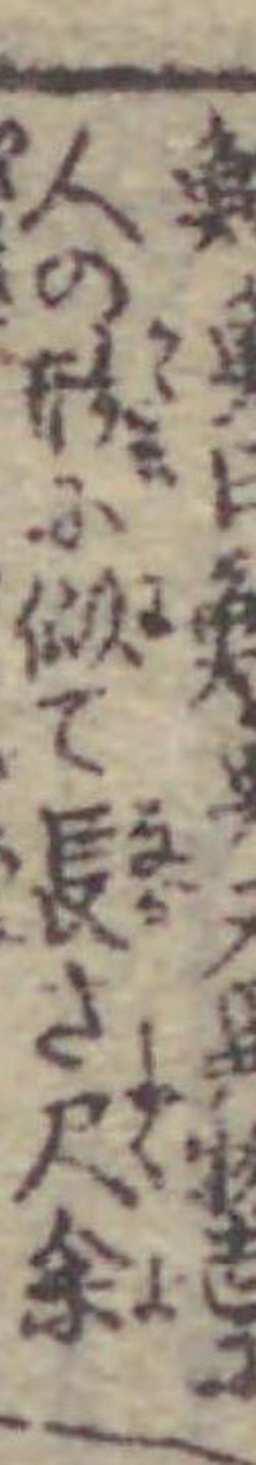人の形に似て長さ尺余
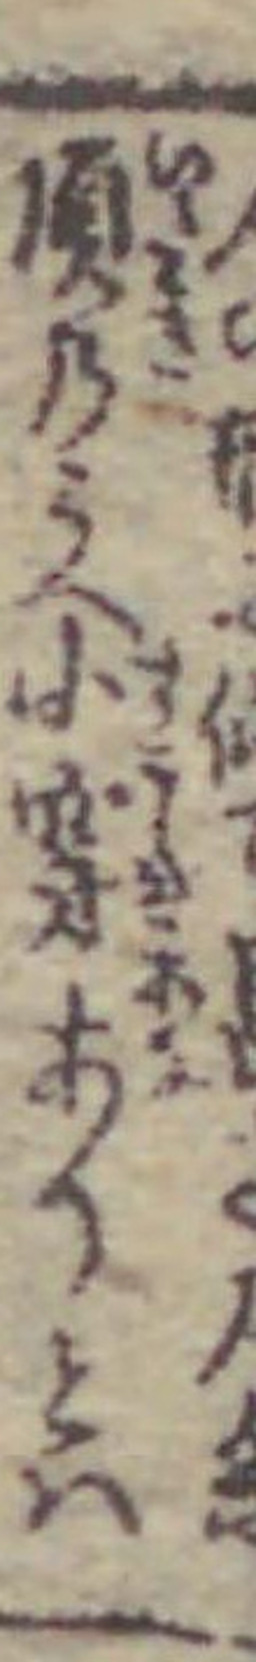頂のうへ小穿ありとは
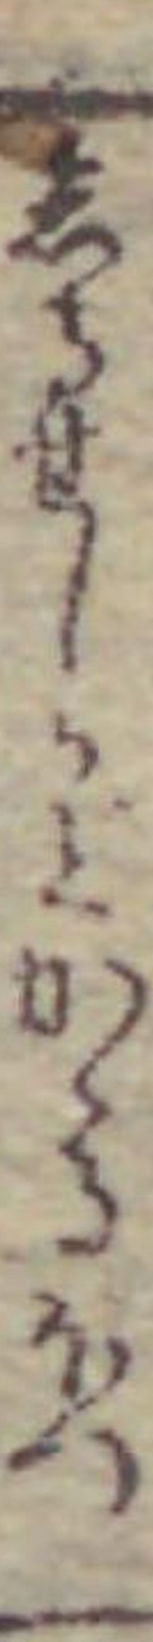しるせしかどかゝるほつ
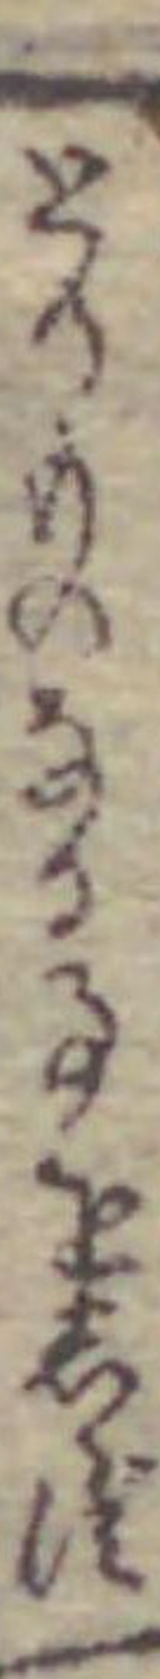とりものなる事をしらず
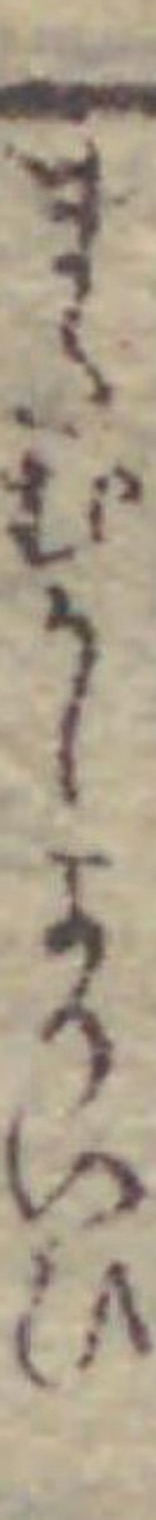またむかしよりいひ
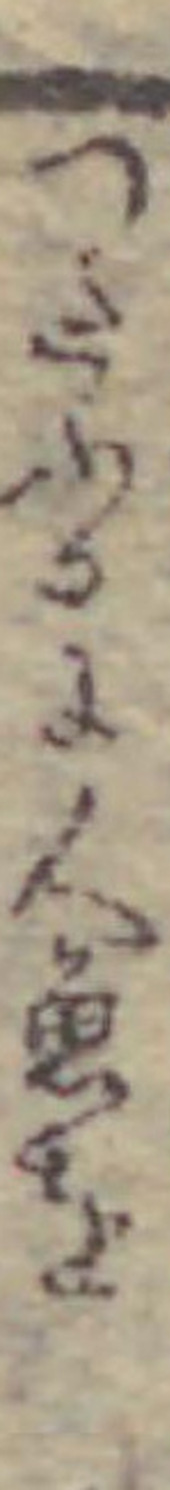つたふるに人魚を
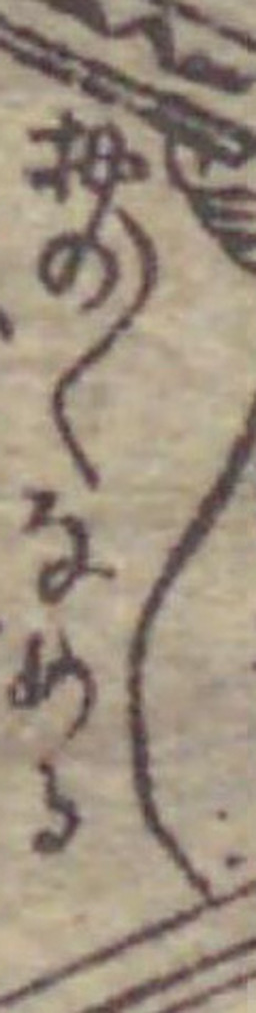おの〳〵なめる
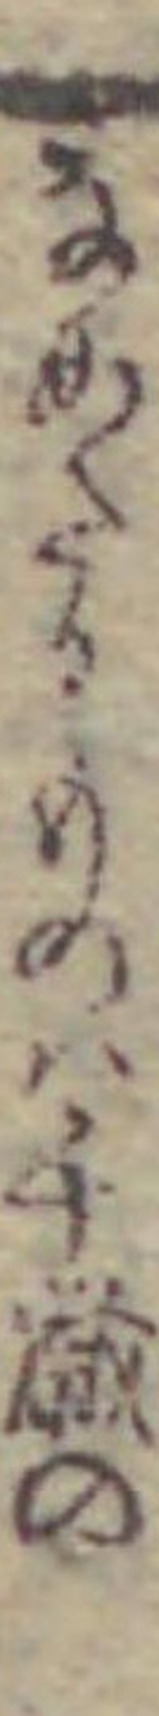なめたるものは千歳の
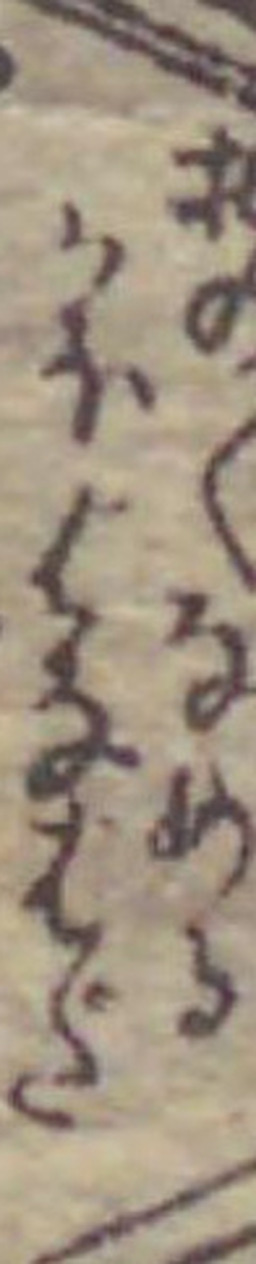かほはなはだ
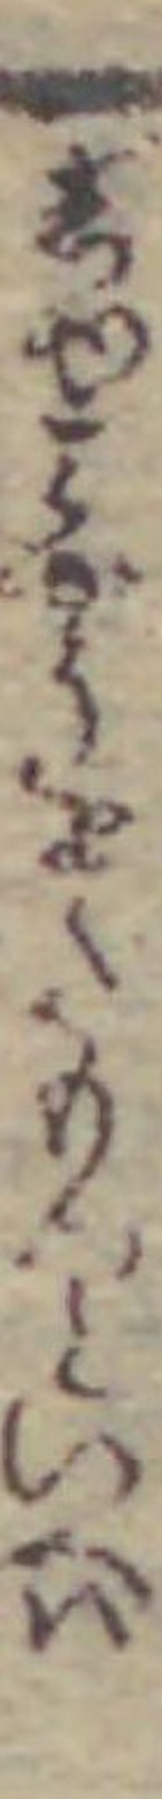じゆみやうをたもつといへは
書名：箱入娘面屋人魚 3巻
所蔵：国立国会図書館 National Diet Library, JAPAN
